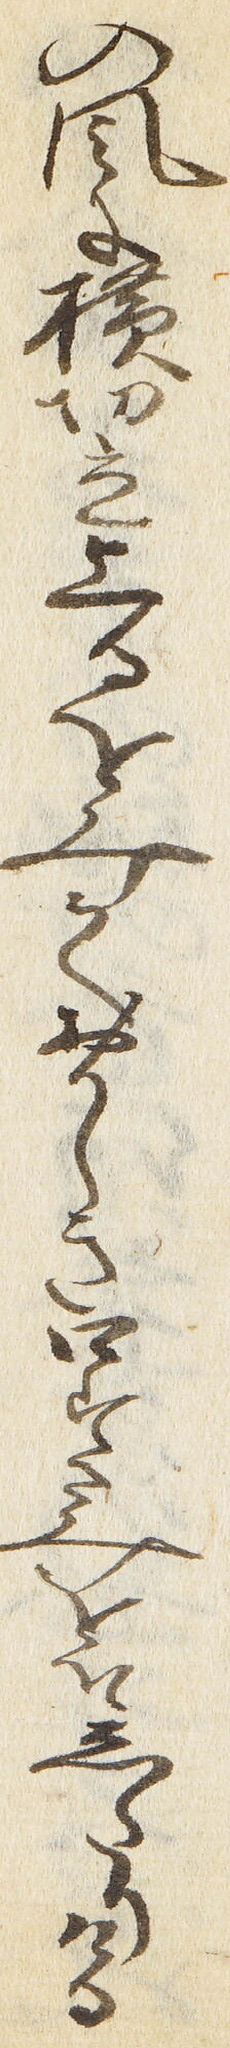の風に横切立上るをみておかしき口すさみをそしたりける
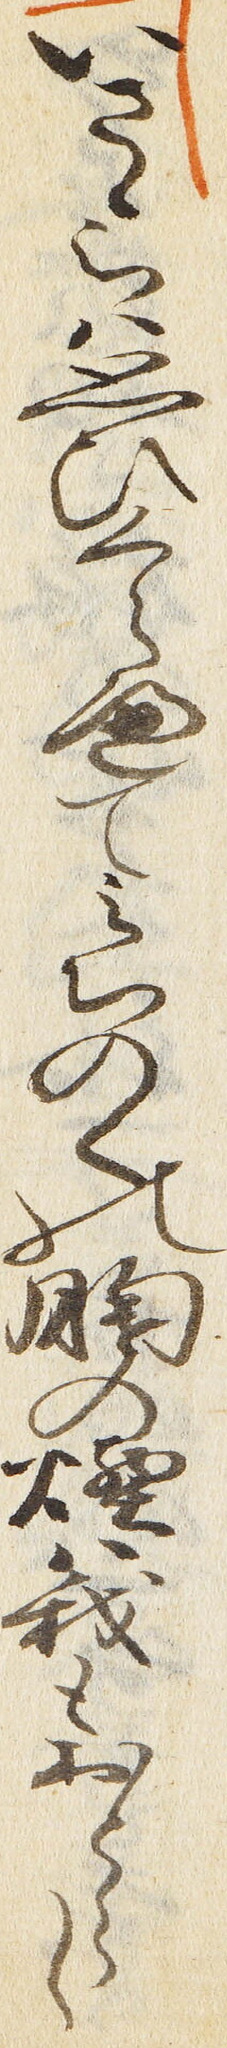「いささらは思ひくらへてみちのくの胸の煙は我もおとらし
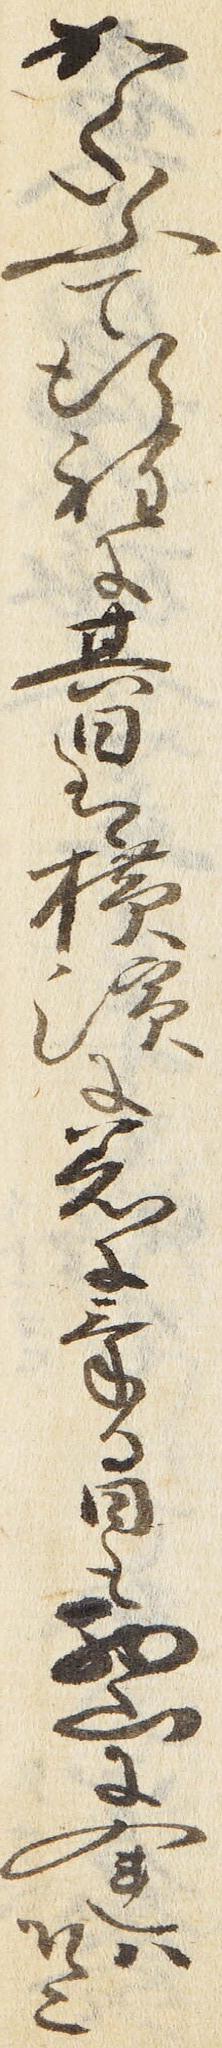かくいふて行程に其日は横浜に着にける日も西山に入れはそこ
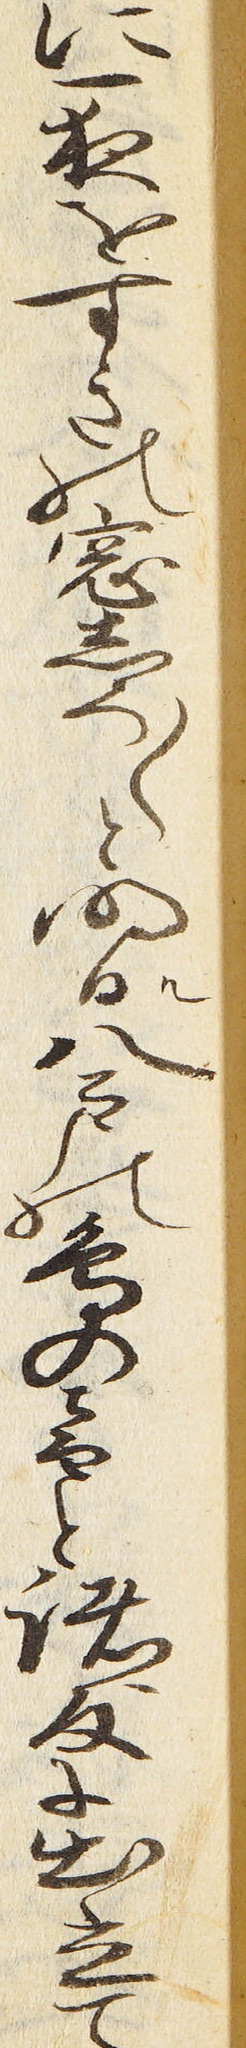に一夜をすきの窓しろ〳〵と明る八戸の鳥の音と諸友に出立て
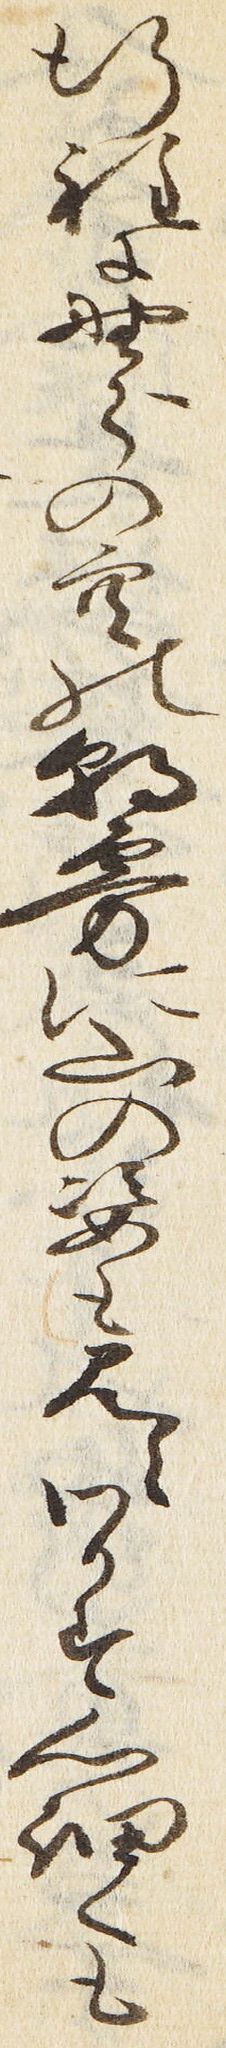行程に野分の空の朝霧に山の姿も見えわかす心細くも
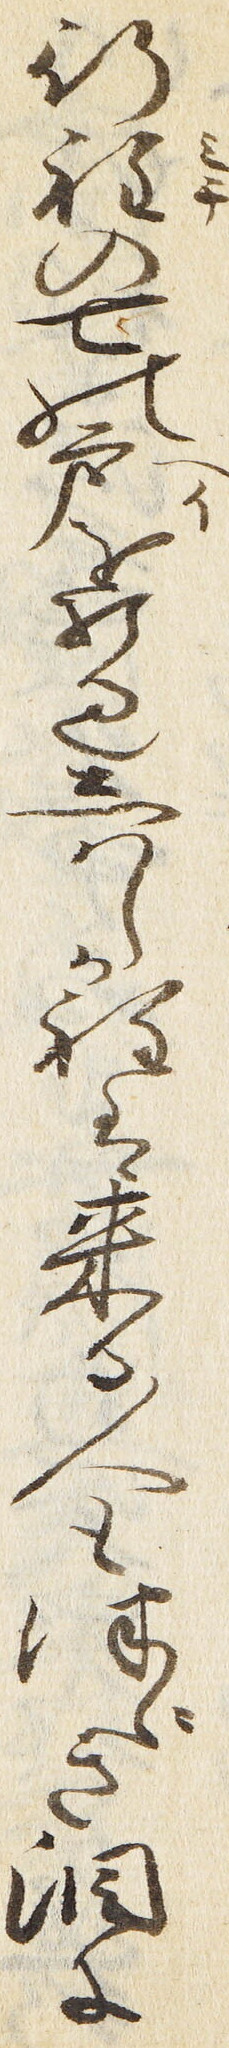行程の七の戸を打過しはしか程は来る人もつゞき調子
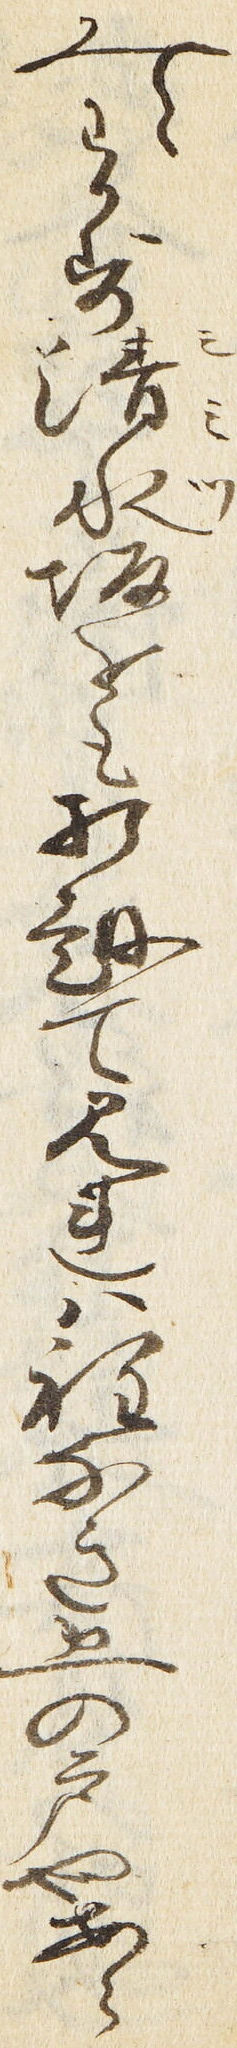みえわかす清水坂をも打越て見れは程なき五の戸也あら
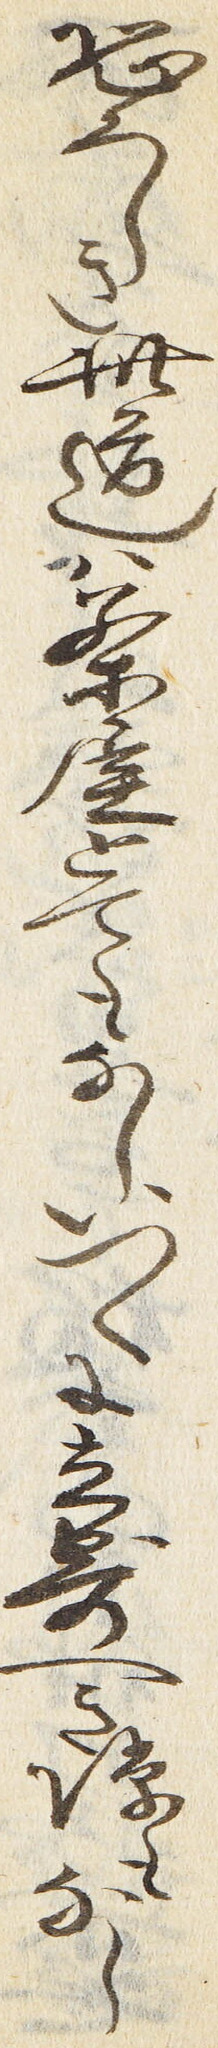恐ろしき此道は茶屋とてもなしいつくに立寄へき隙もなし
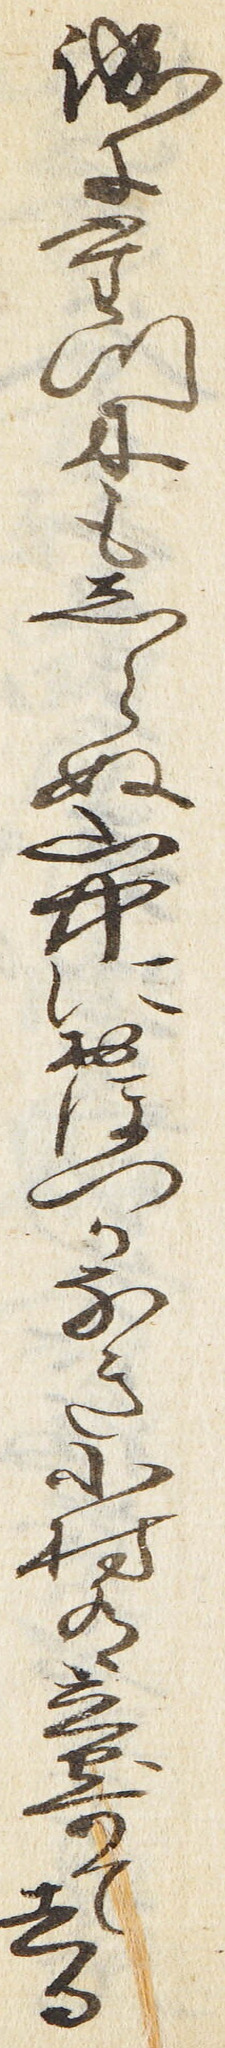誠にたつ木もしらぬ山中におほつかなき小村有立寄て去る
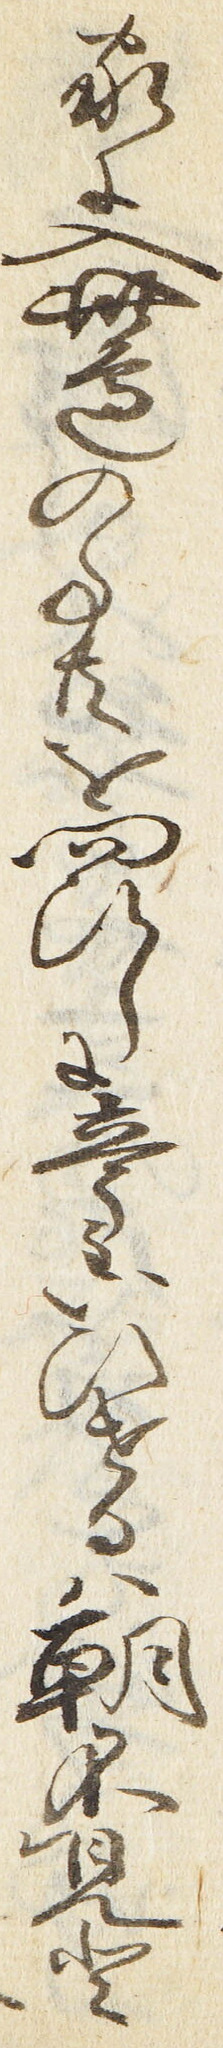家に入此辺の事共を問ひしに亭主いひけるは朝不見と
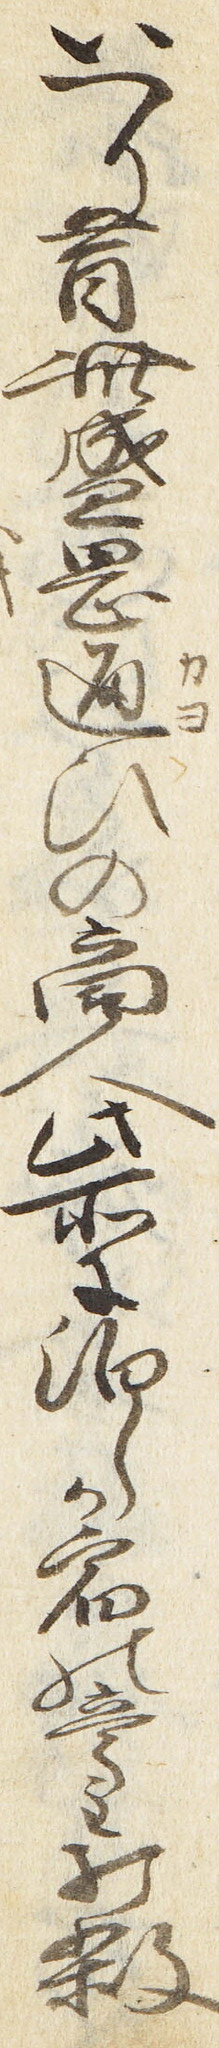いへり昔此盛岡通ひの商人此所に泊しか宿の亭主打殺
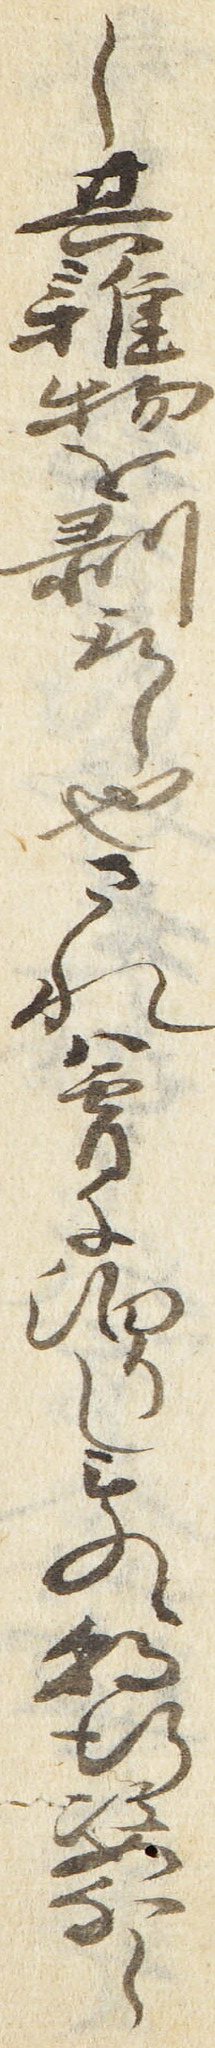し其雑物を剥取し也されは宵に泊りしものゝ朝行姿なし

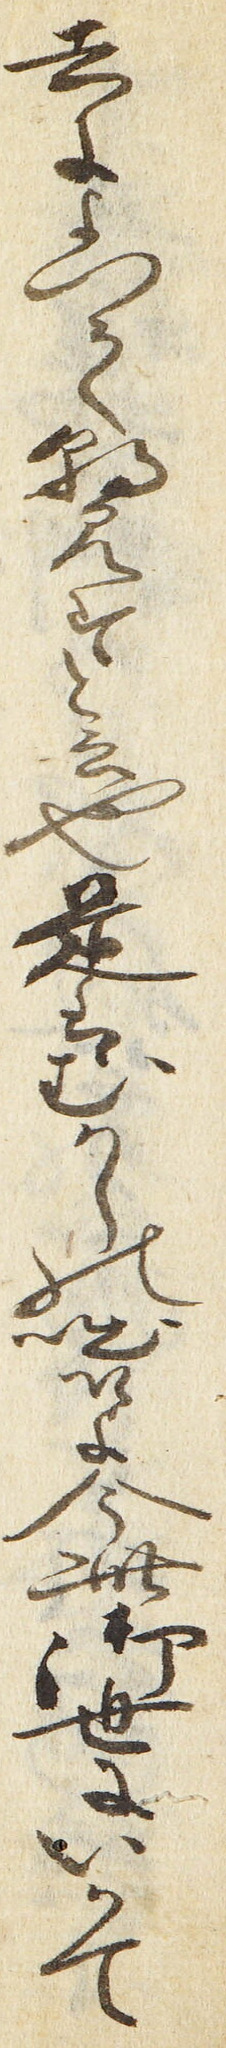去によつて朝見すと云也是そむかしの咄そよ今此御世にいかて
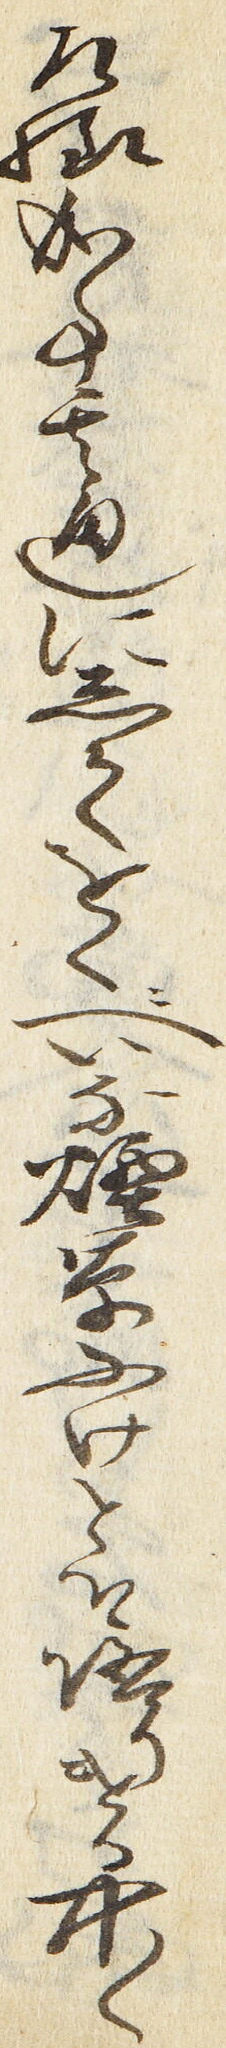左様成事其通にしてをくべいな煙草ふけとそ語りける中〳〵
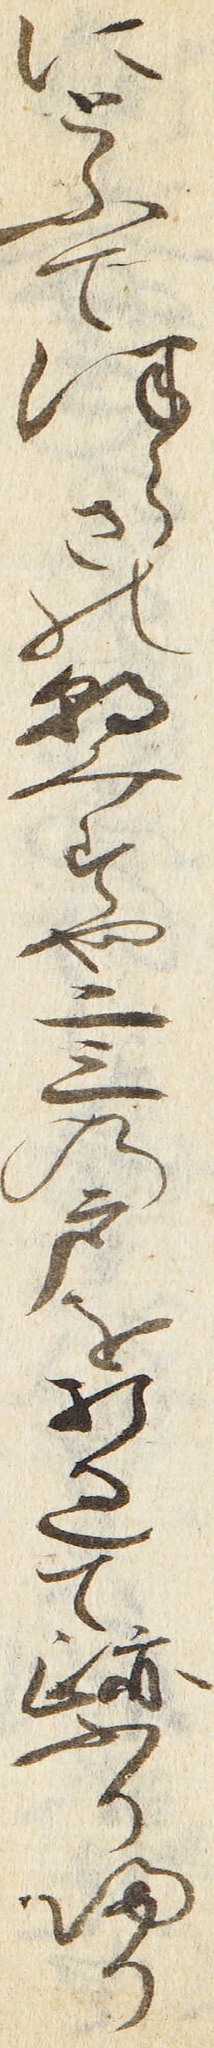にとふてつらさの朝みすや二三の戸を打過て跡ふり帰り
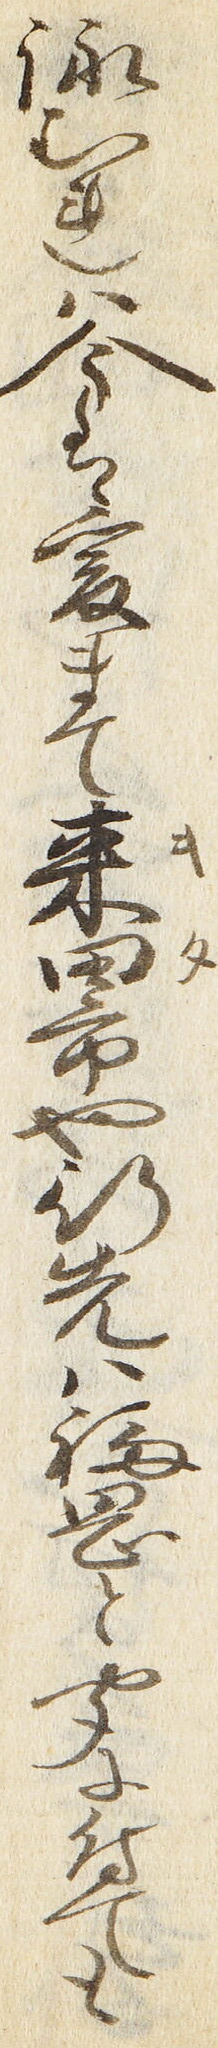詠むれは今は爰まて来田市や行先ハ福岡と聞に付ても
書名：海陸世話日記
